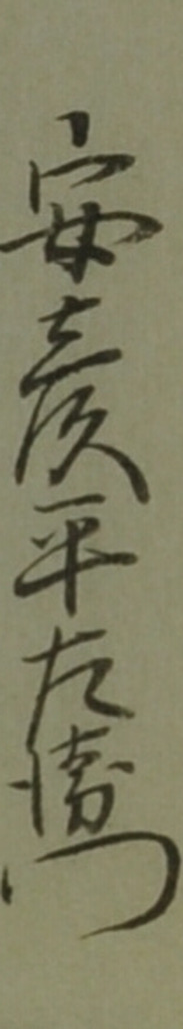安彦平左衛門
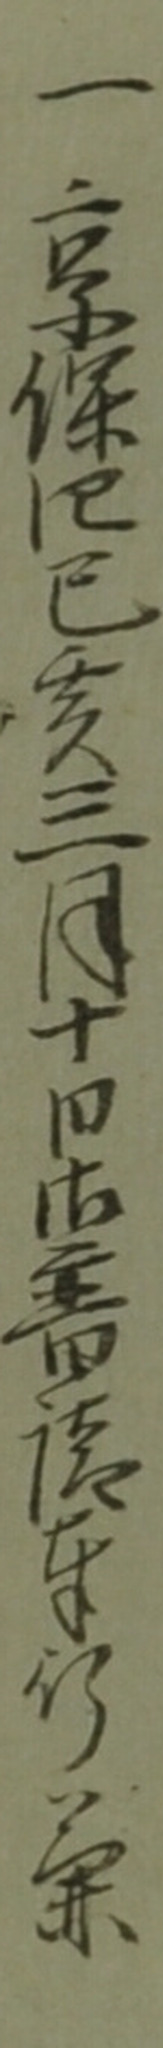一享保四己亥三月十日御普請奉行兼
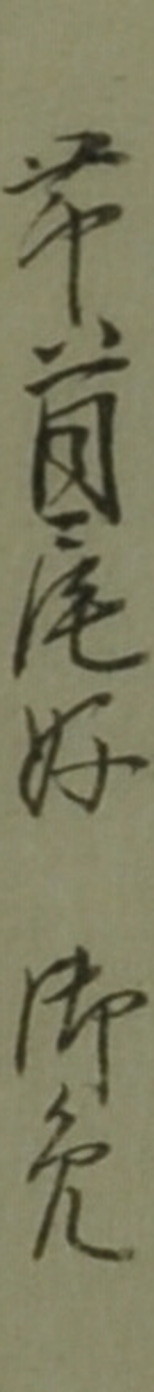帯首尾好御免
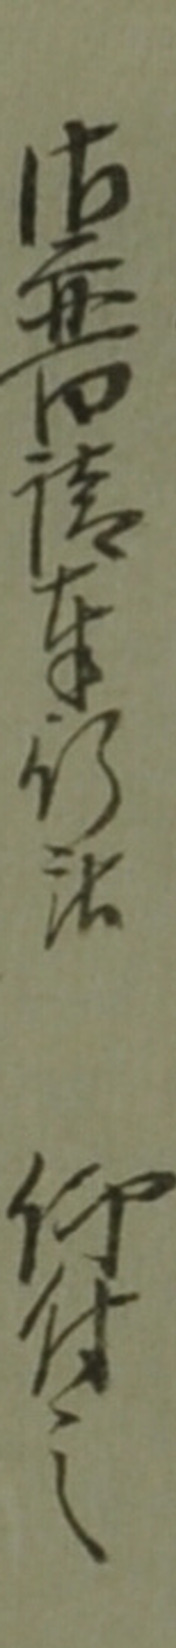御普請奉行被仰付之
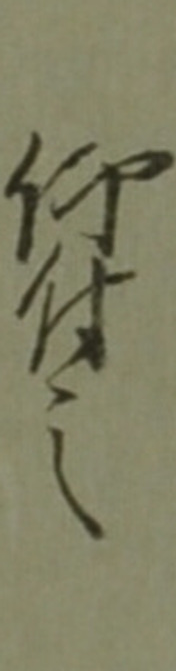仰付之
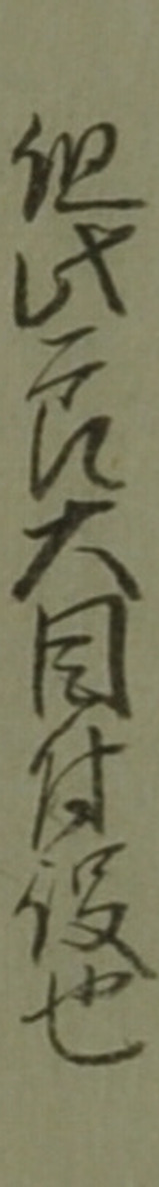但此節大目付役也
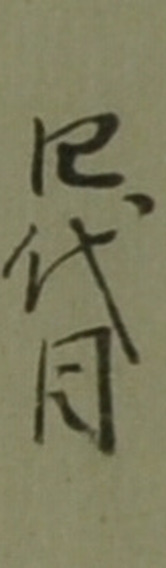四代目
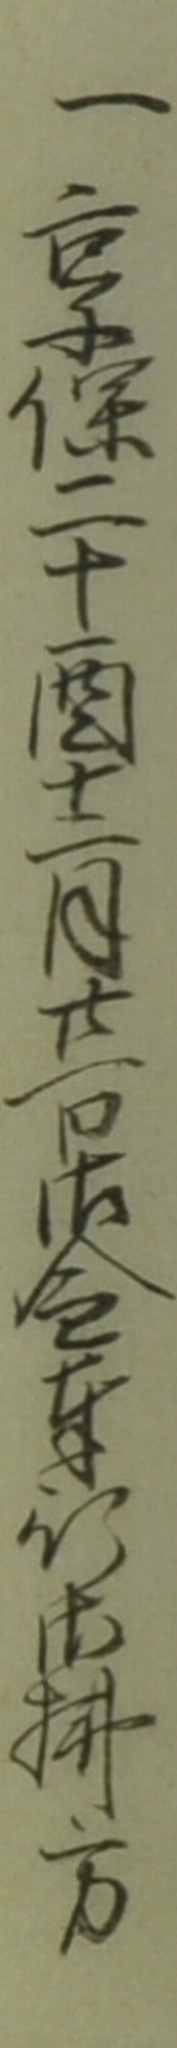一享保二十酉十二月廿一日御金奉行御払方
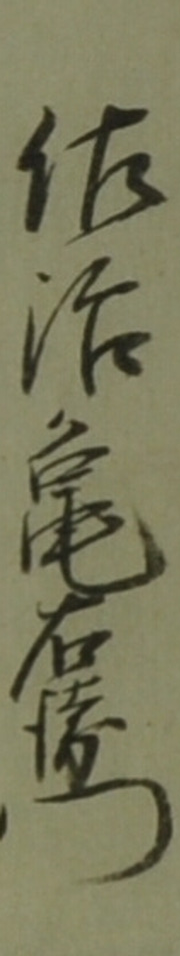佐治亀右衛門

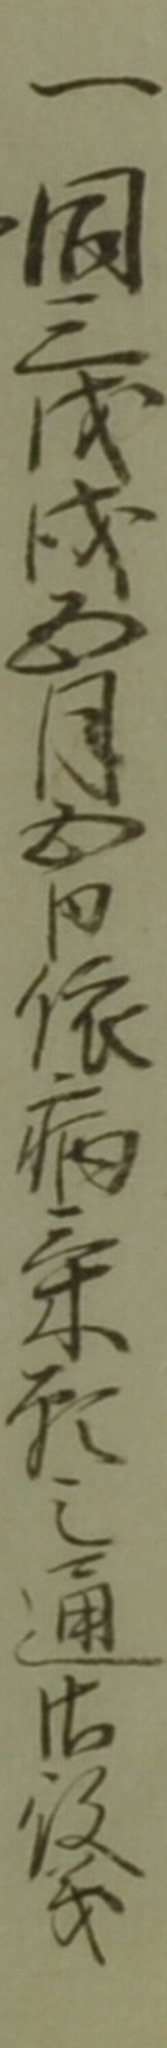一同三戊戌五月五日依病気願之通御役義
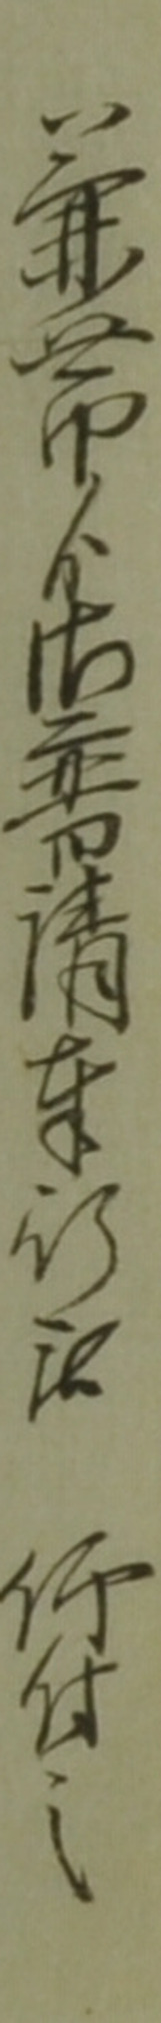兼帯ゟ御普請奉行被仰付之
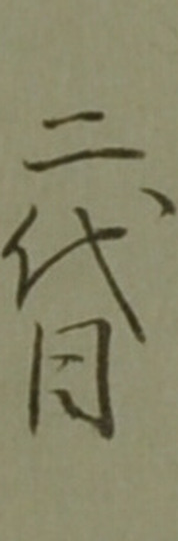二代目
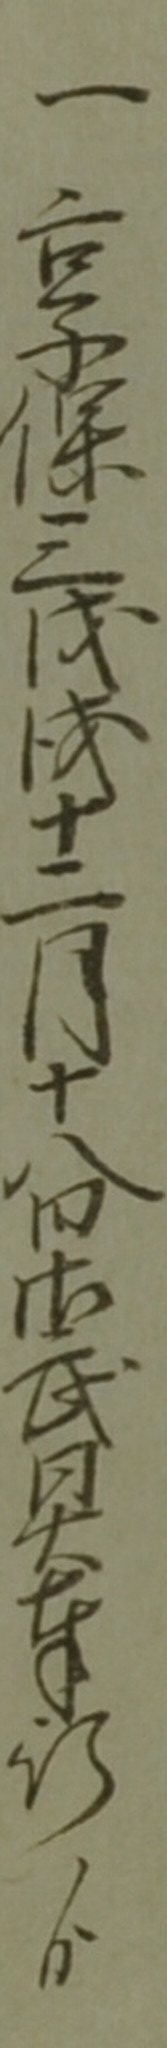一享保三戊戌十二月十八日御武具奉行ゟ
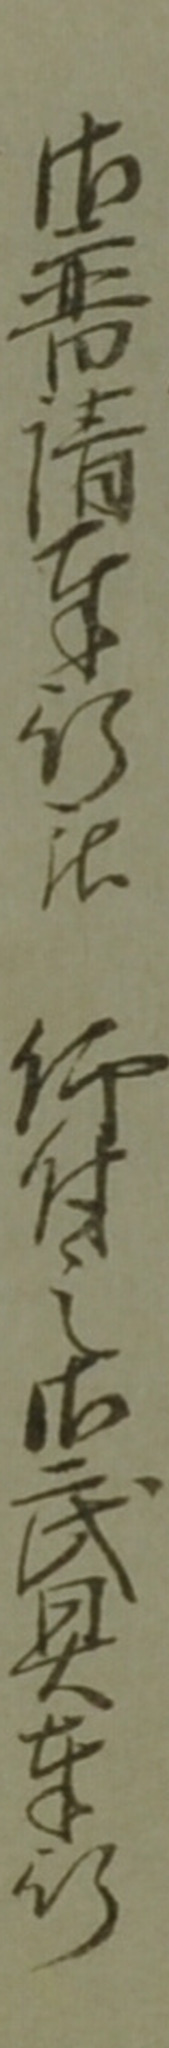御普請奉行被仰付之御武具奉行
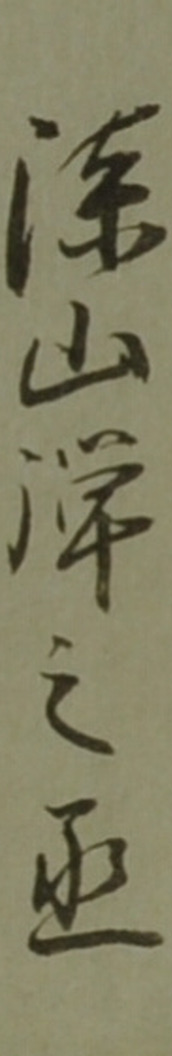漆山弾之丞
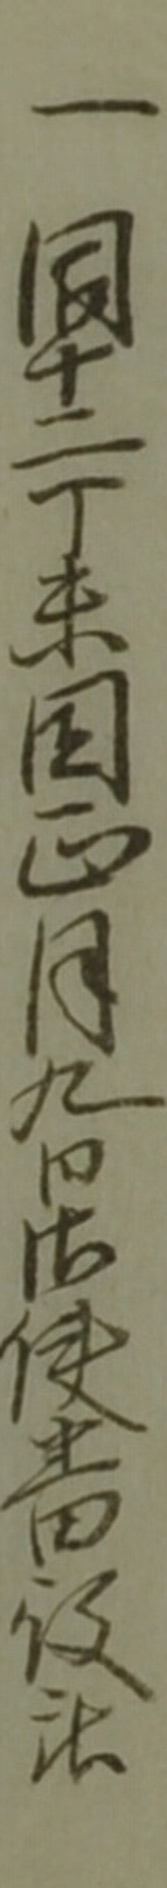一同十二未閏正月九日御使番役被
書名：諸御役代々録（六）
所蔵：伊那市立高遠町図書館・合同会社AMANE
